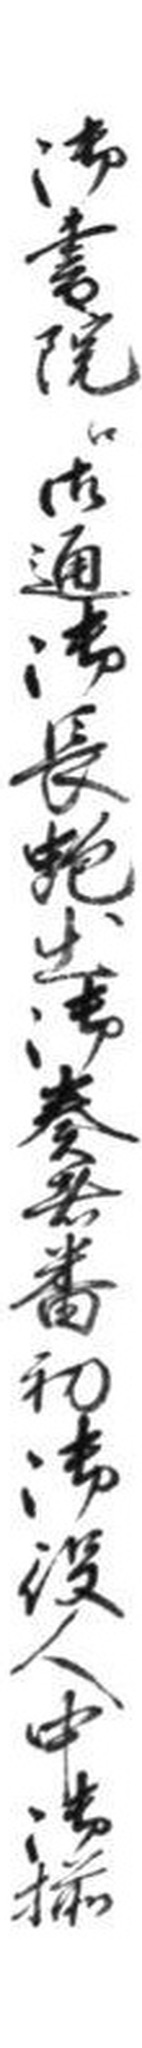御書院江御通御長蚫出御奏者番初御役人中御揃
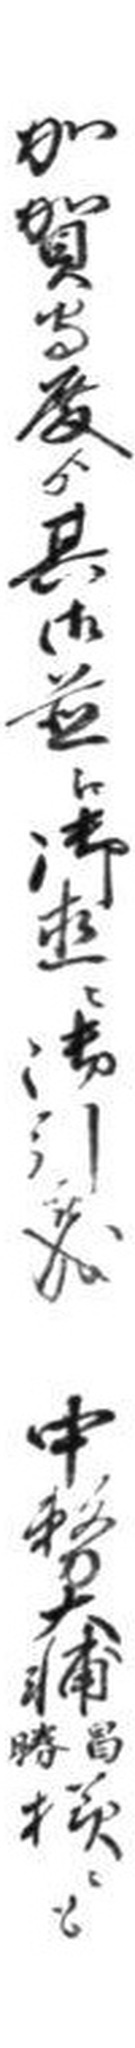加賀守殿ゟ其御並江御直々御引被成中務大輔昌時様ニも
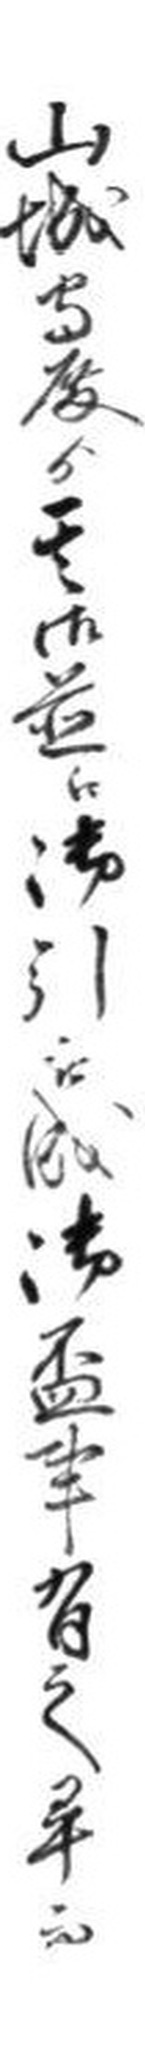山城守殿ゟ其御並江御引被成御盃事有之畢而
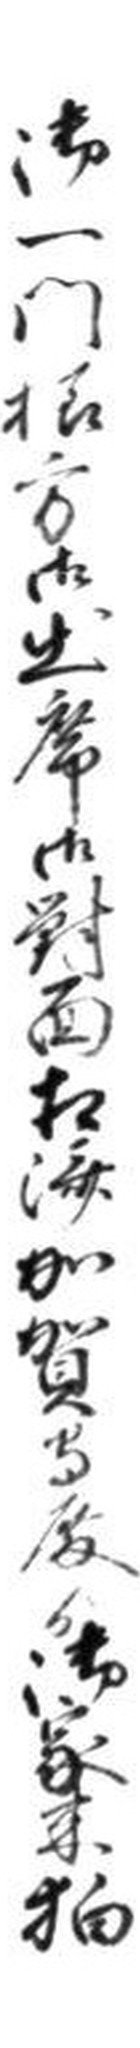御一門様方御出席御対面相済加賀守殿ゟ御家来狛
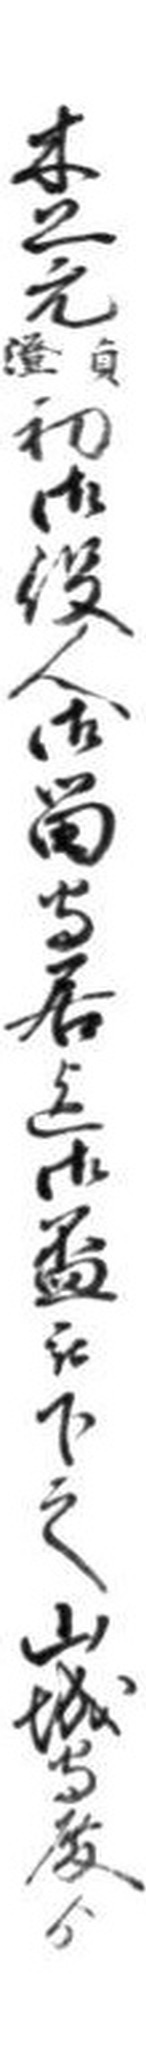杢允貞澄初御役人御留守居迄御盃被下之山城守殿ゟ
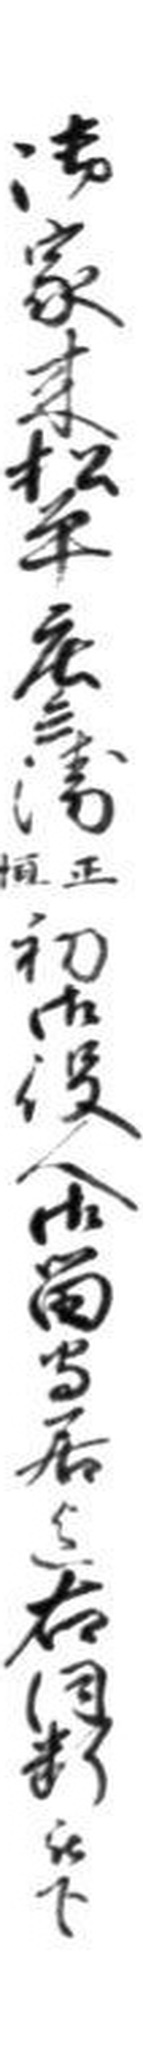御家来松平庄兵衛正恒初御役人御留守居迄右同断被下
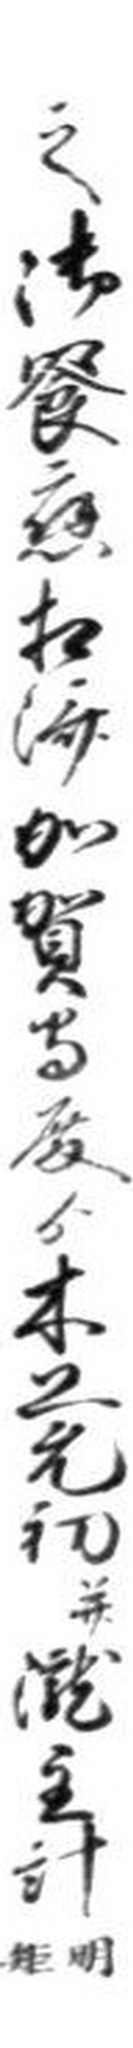之御饗応相済加賀守殿ゟ杢允初并瀧主計明矩
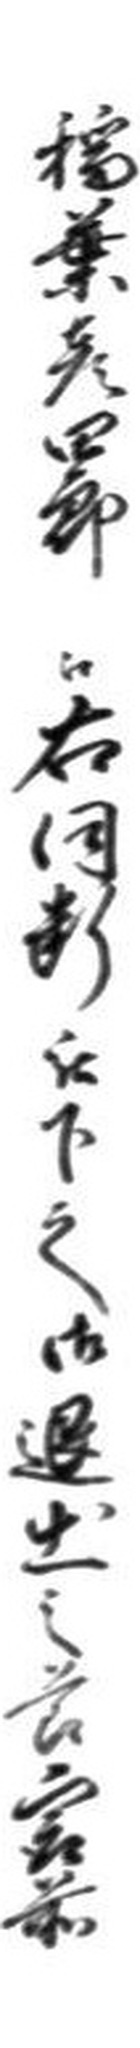稲葉彦四郎江右同断被下之御退出之節最前
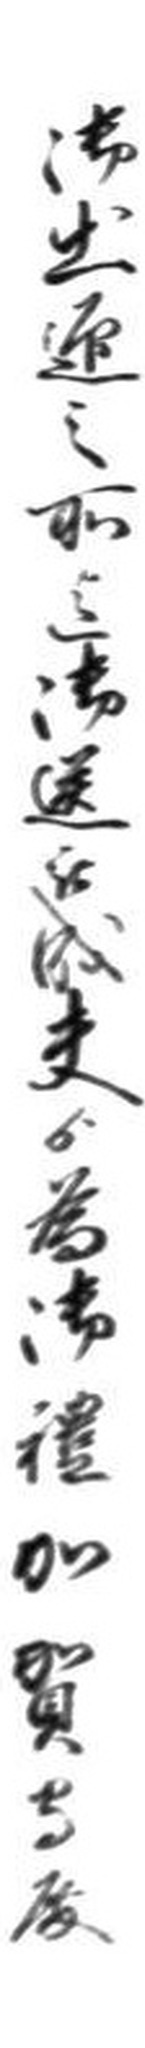御出迎之所迄御送被成夫ゟ為御礼加賀守殿
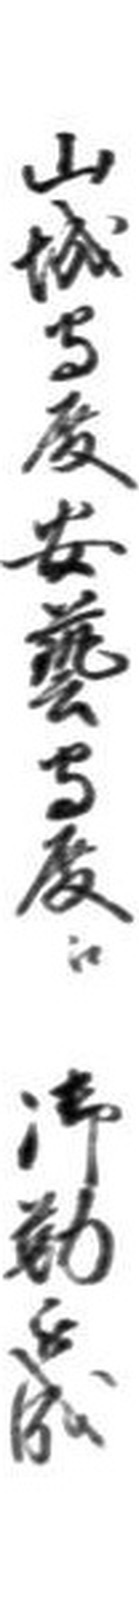山城守殿安芸守殿江御勤被成
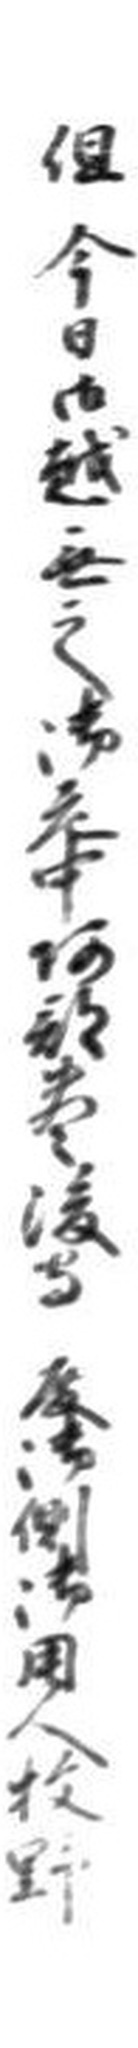但今日御越無之御老中阿部豊後守殿御側御用人牧野
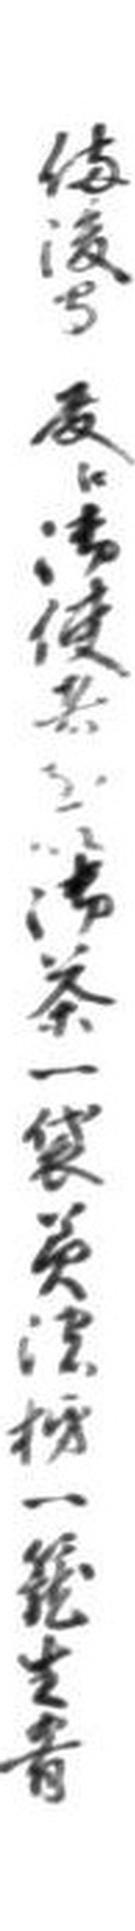備後守殿江御使者を以御茶一袋美濃柿一籠生肴
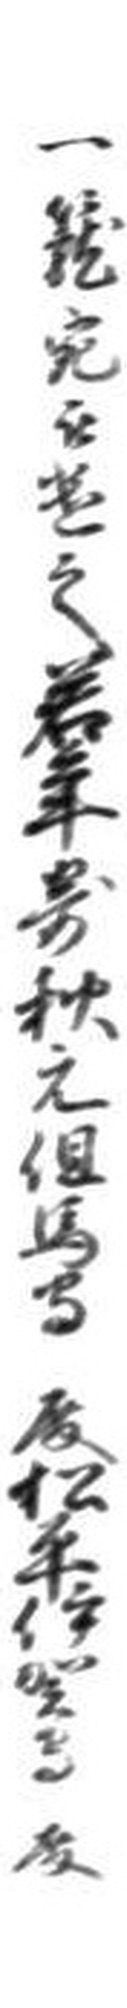一籠宛被遣之若年寄秋元但馬守殿松平伊賀守殿
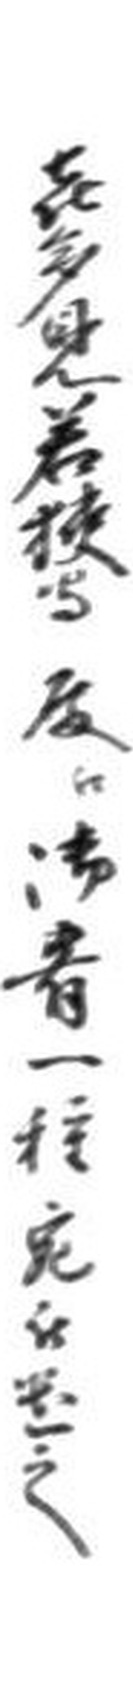喜多見若狭守殿江御肴一種宛被遣之

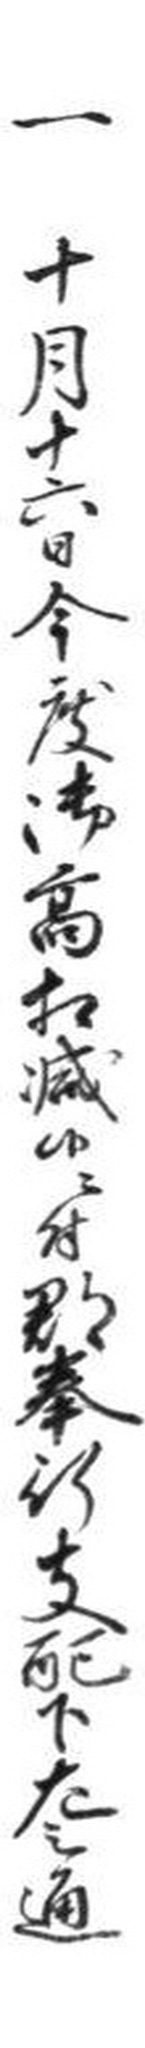一十月十六日今度御高相減候ニ付郡奉行支配下左之通
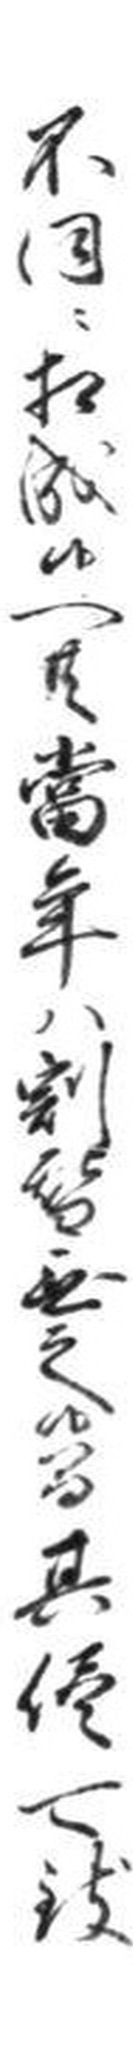不同ニ相成候へ共当年ハ割替無之候間其儘可致
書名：家譜 十六 吉品公 従貞享三年閏三月到同四年
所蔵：福井県文書館 Fukui Prefectural Archives
